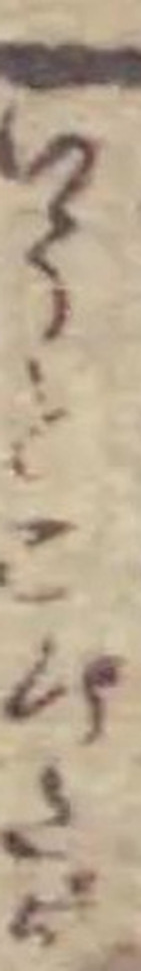いうところたが
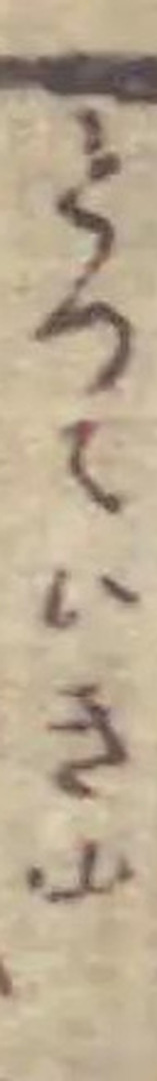とつていき山

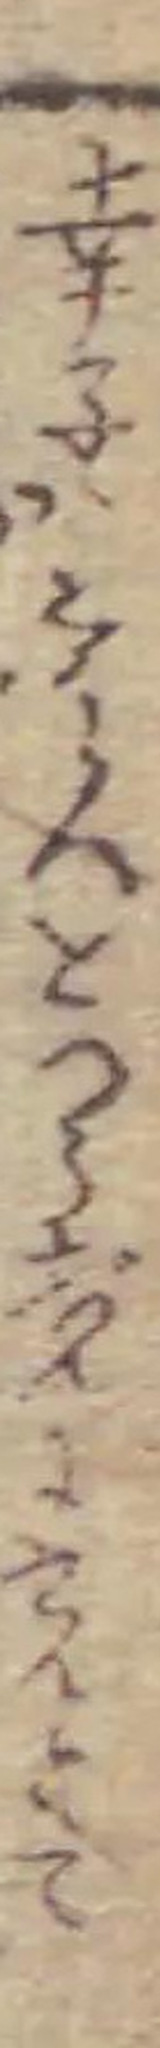幸子はとう人をつうじんにせんとて
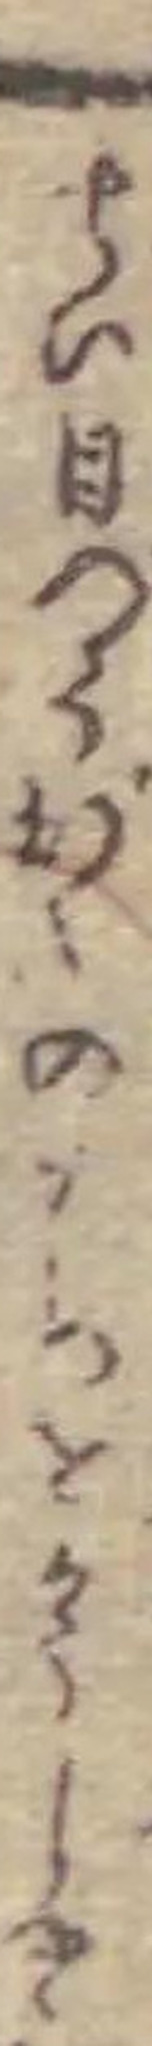まい目つうがくのをかうしやくして
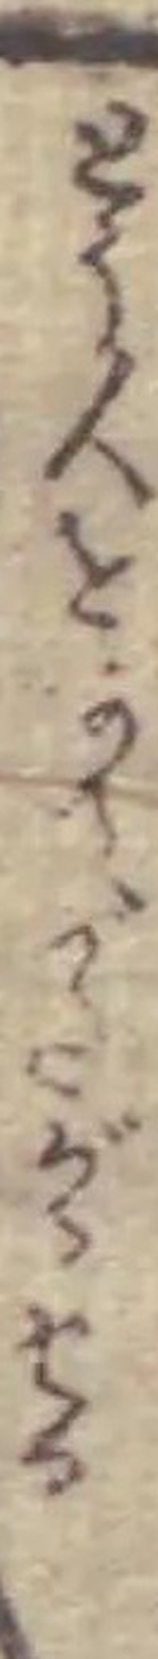とう人をありがたがらせる
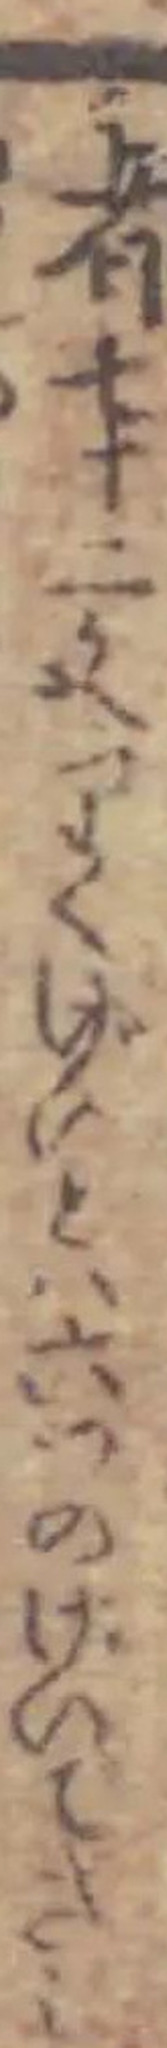者七十二文りくげいとは六つのげいてさみ
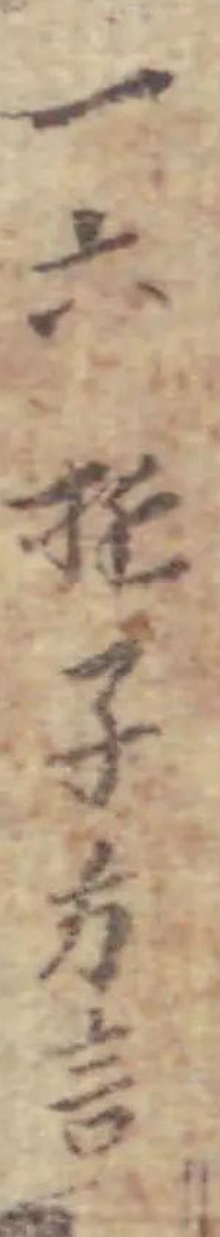一六遊子方言
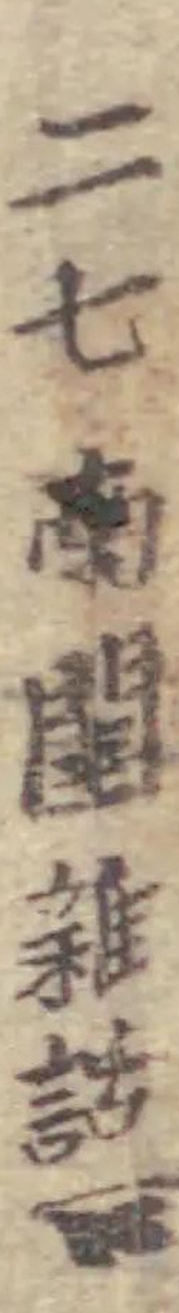二七南閨雑話
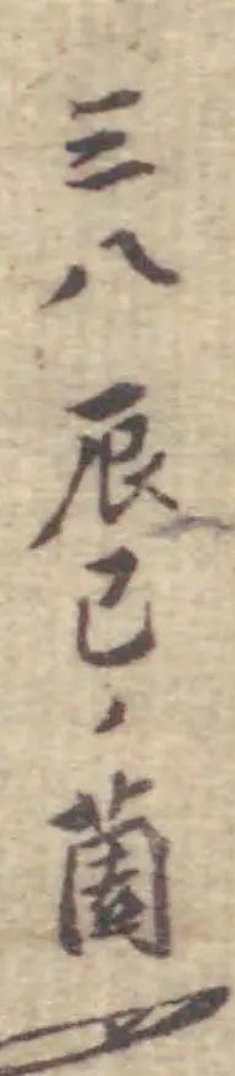三八辰巳ノ園
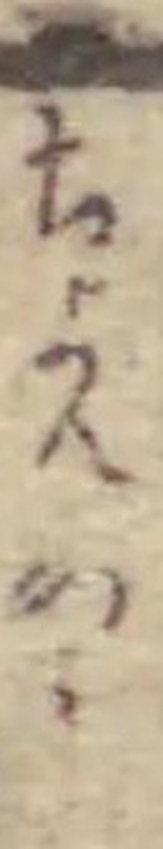ちよんのみ
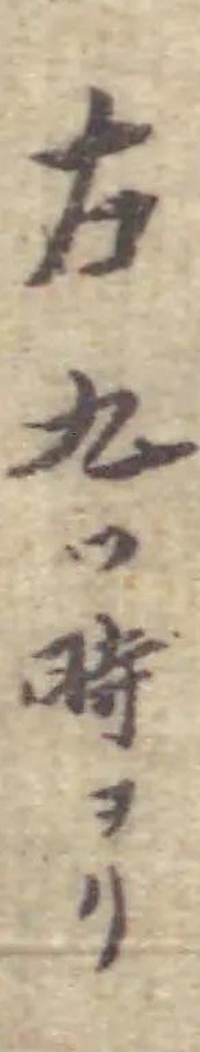右九つ時より
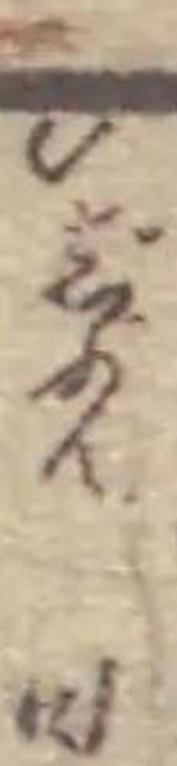いじふん

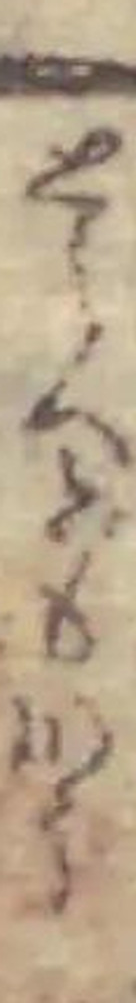とう人どもかう
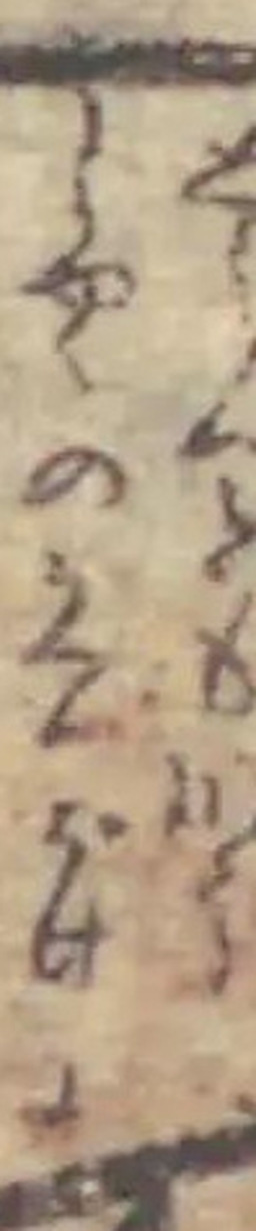しやくのかへりがけに
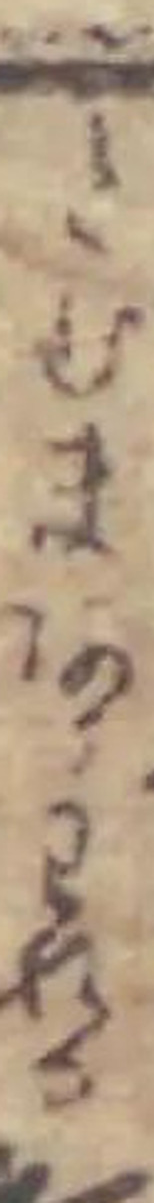とむまあわれる
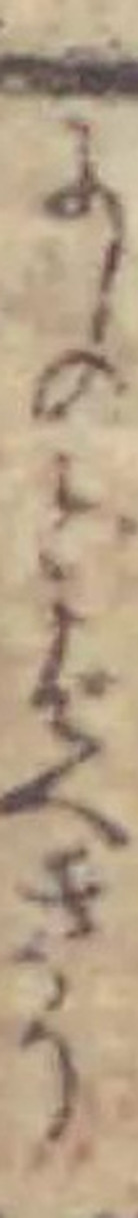にしのどばへきり
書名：茶羅毛通人 3巻
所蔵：国立国会図書館 National Diet Library, JAPAN
